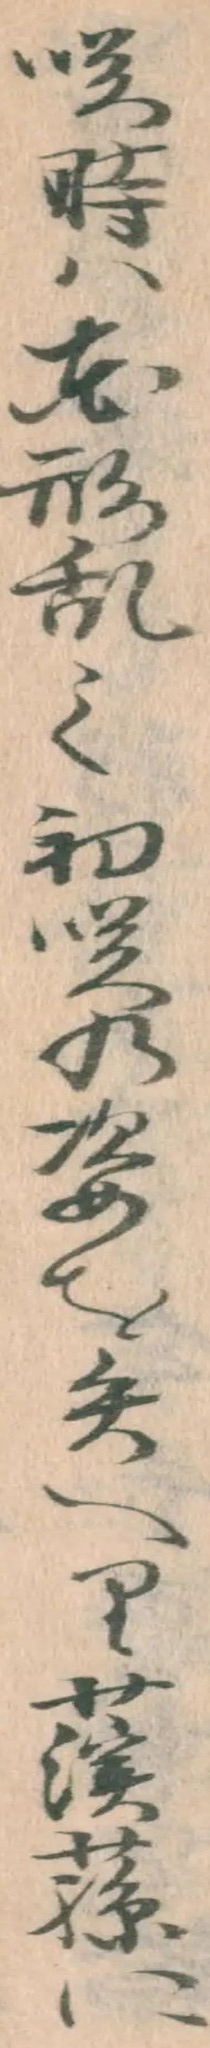咲時ハ花形乱ｔて初咲の姿を失へり藻蓀に
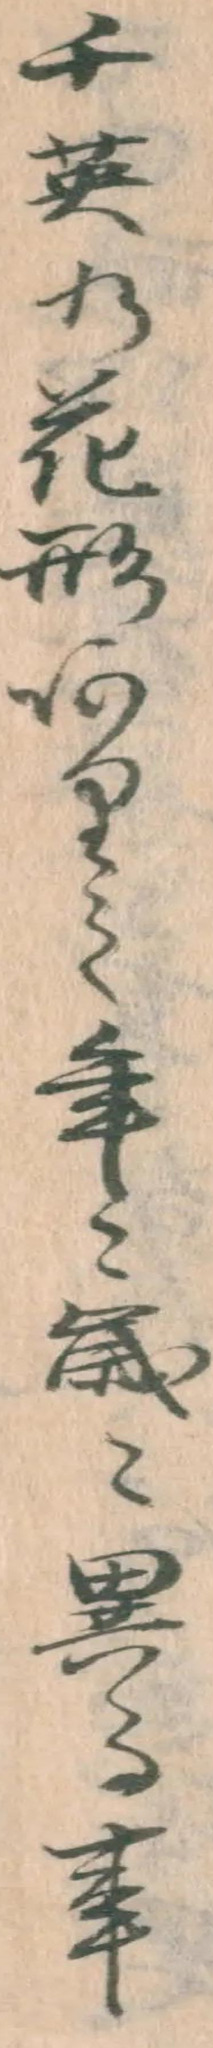千英の花形ありて年々歳々異る事
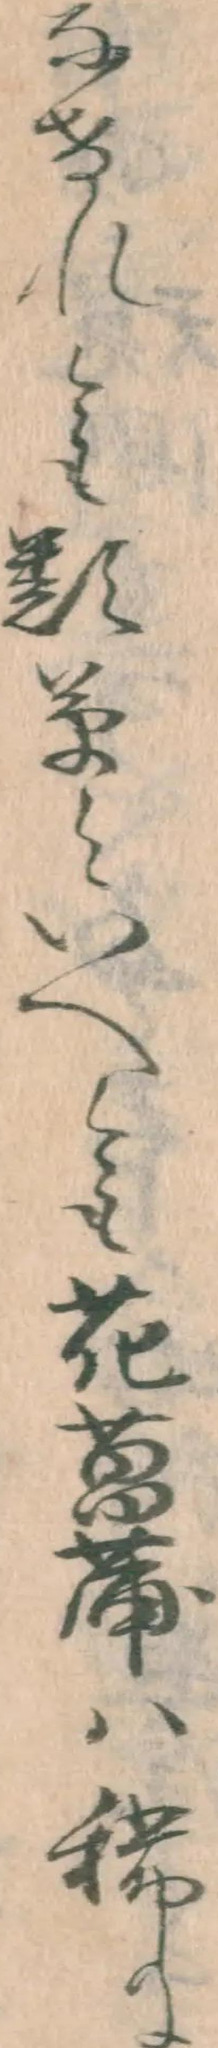なけれとも類草といへとも花菖蒲ハ稀に
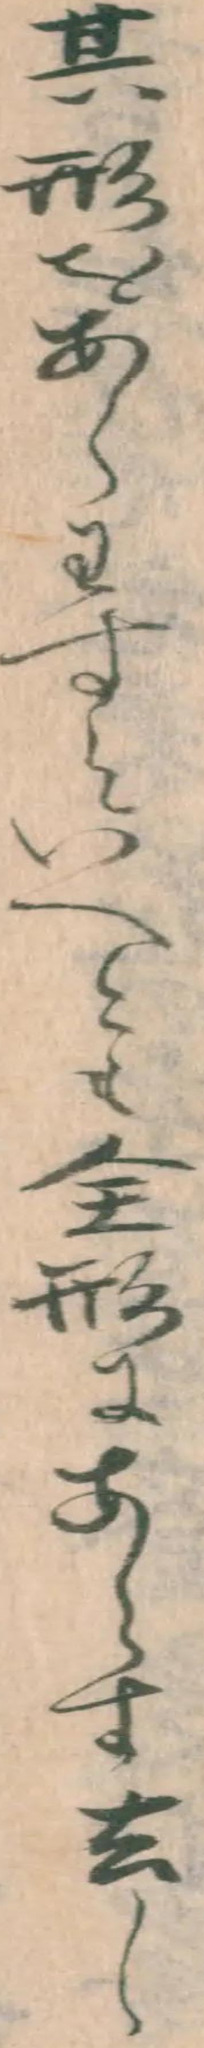其形をあらわすといへとも全形にあらす去し
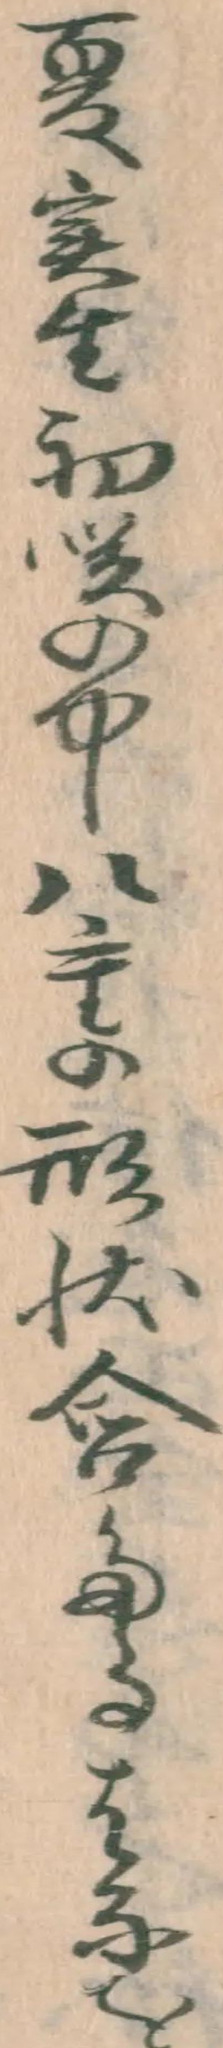夏実生初咲の中八重の形状含たるはなを
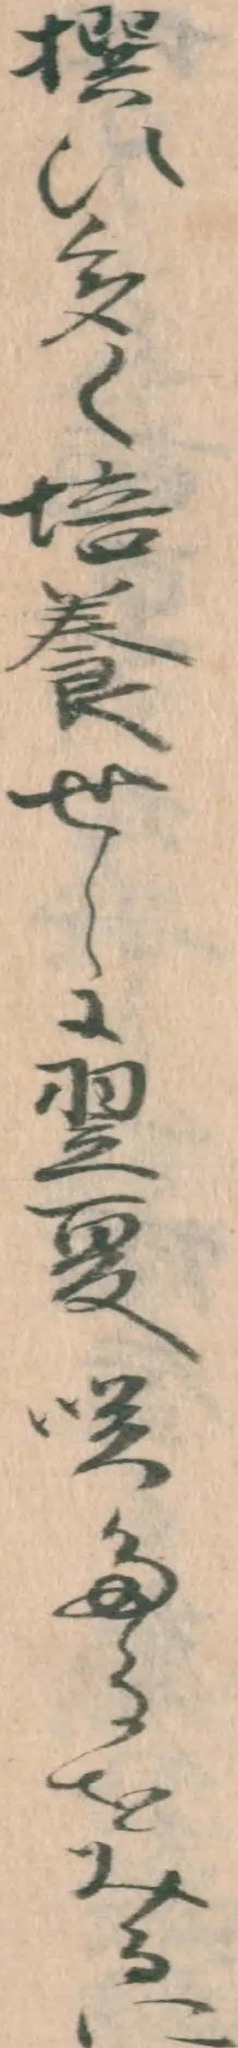撰ひ多く培養せしに翌夏咲たるをみるに
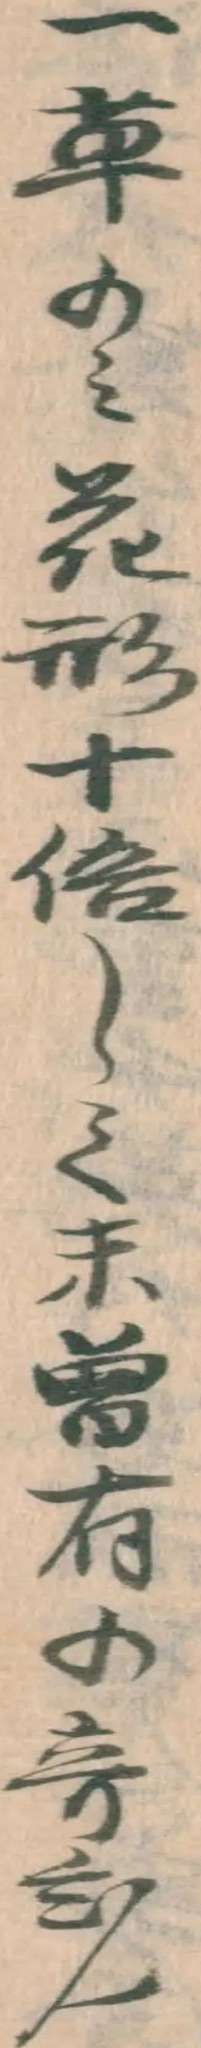一草のミ花形十倍して未曾有の葩
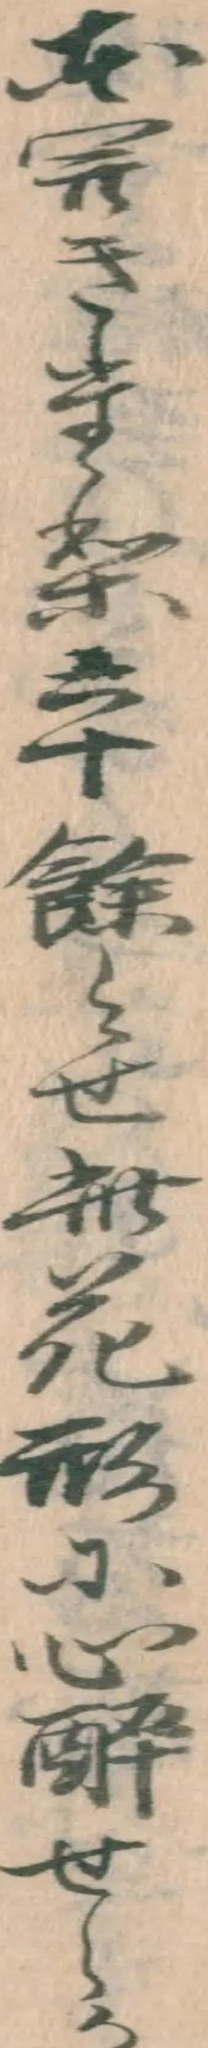花開きたり六十余とせ此花形に心酔せしか
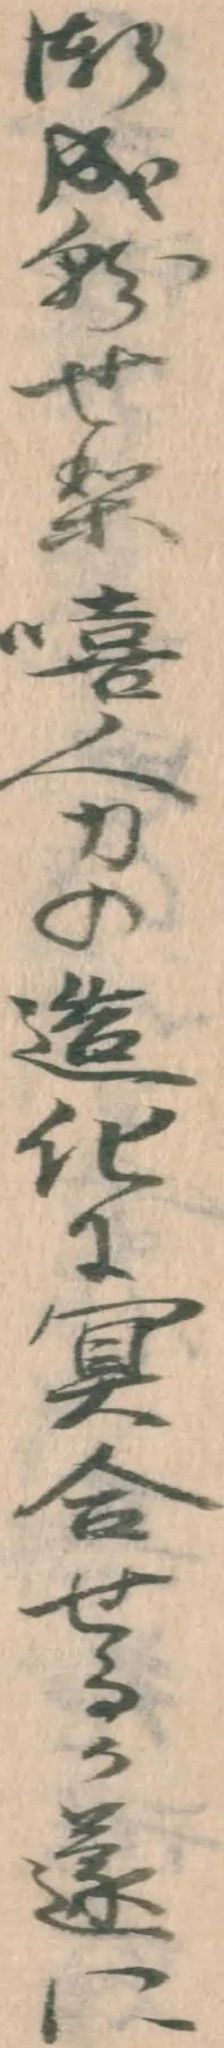漸成願せり嘻人力の造化に冥合せるか遂に
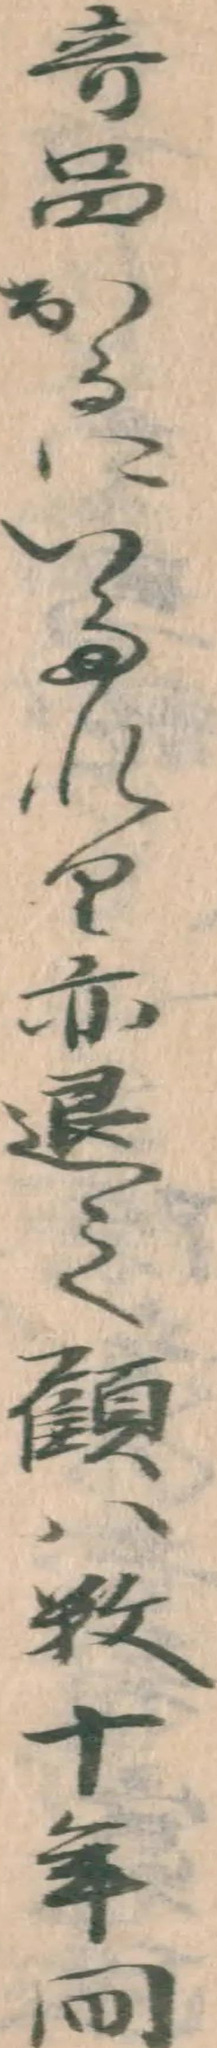奇品出るにいたれり亦退て顧ハ数十年間
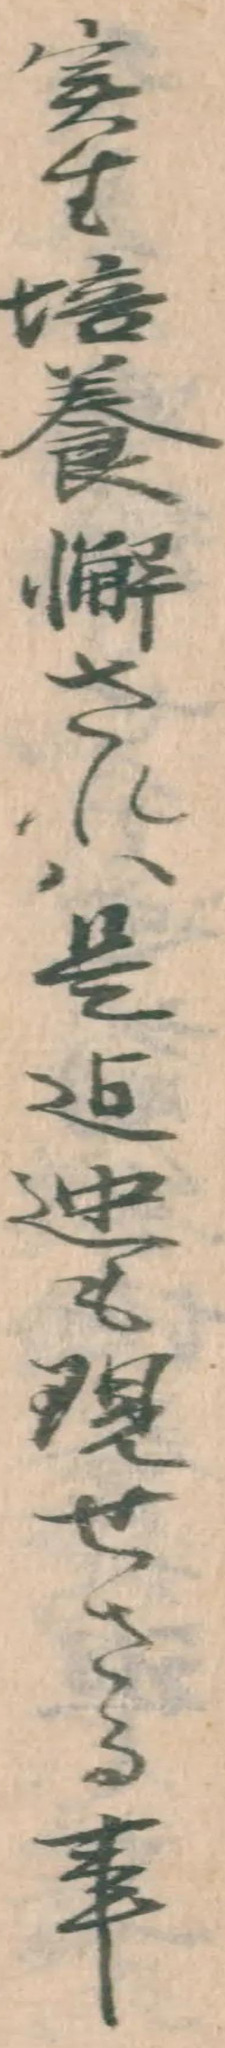実生培養懈されハ是迄迚も現せさる事
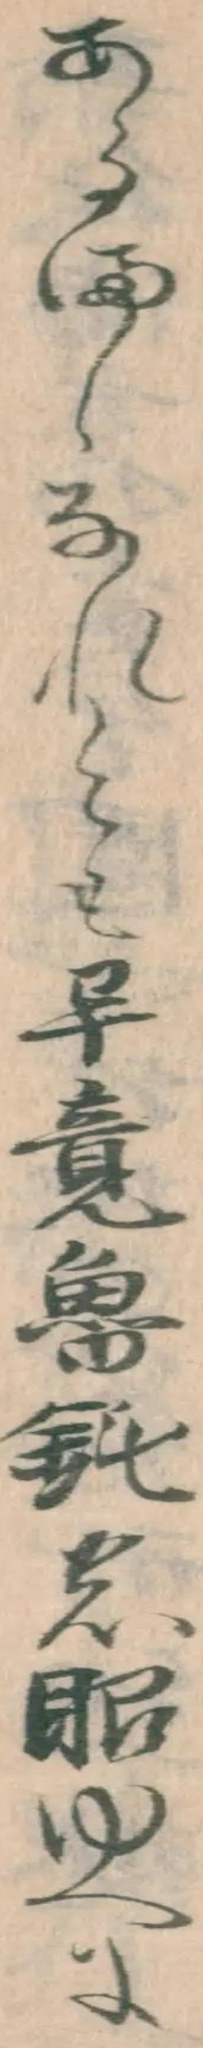あらましなれとも畢竟魯鈍着眼ゆえに
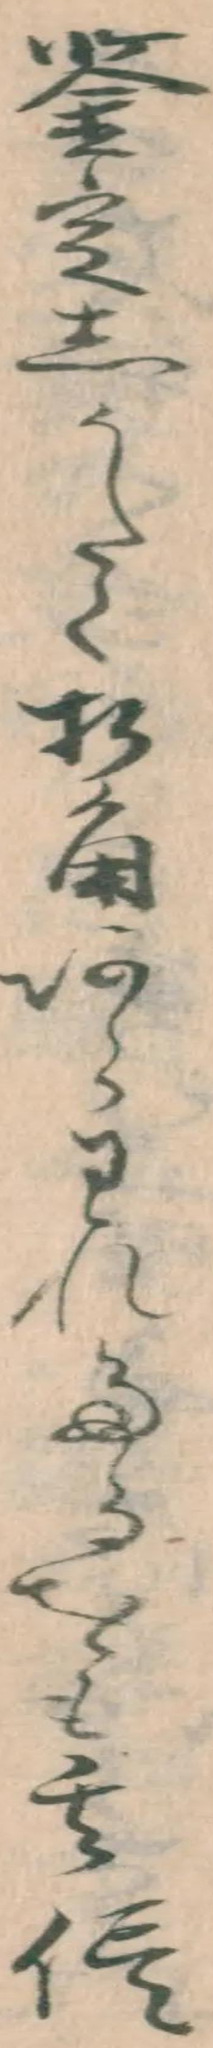筌定しかたく折角あらわれたるをも其侭
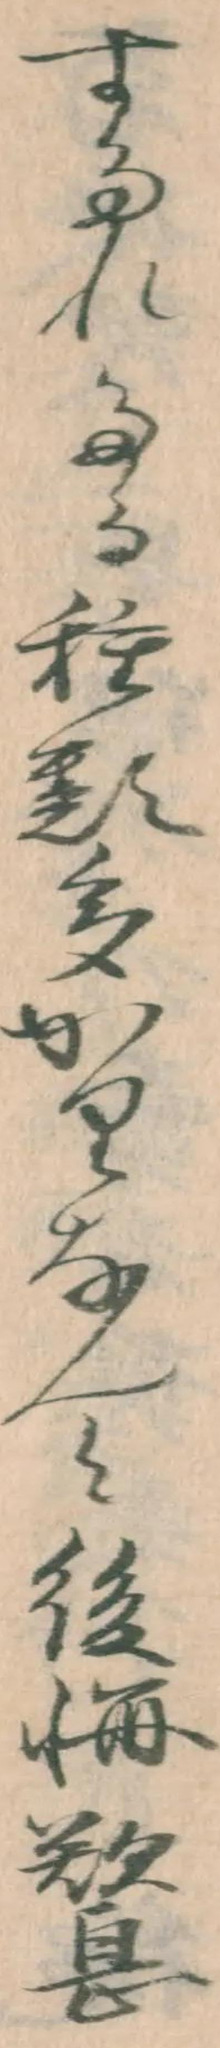すたれたる種数多かりなんと後悔歎息
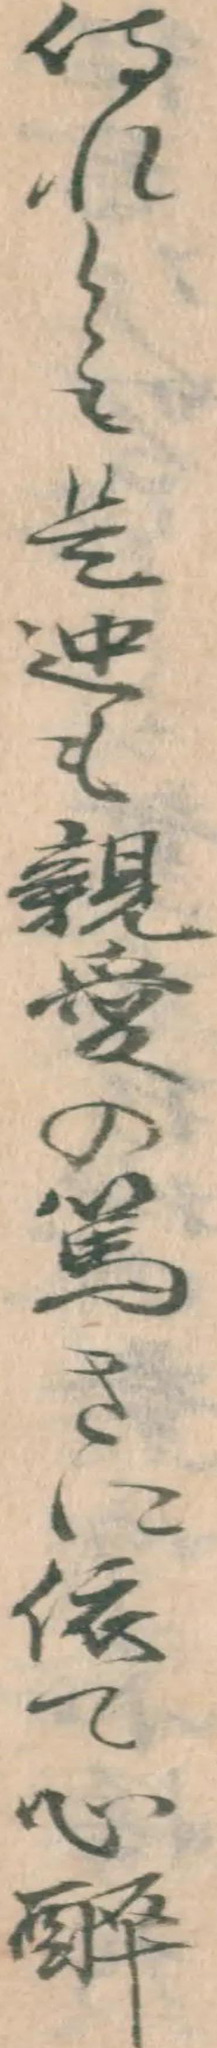侍れとも是迚も親愛の篤きに依て心酔
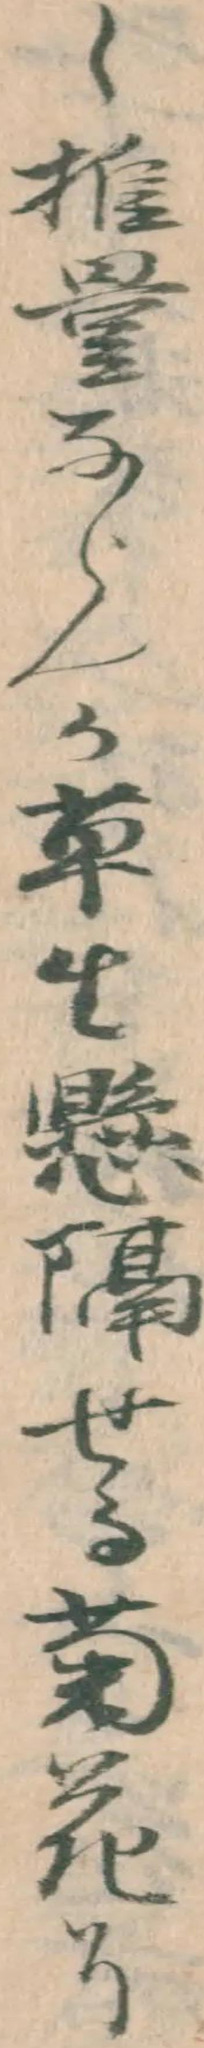し推量ならんか草生懸隔せる菊花に
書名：花菖培養録
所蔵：国立国会図書館 National Diet Library, JAPAN
